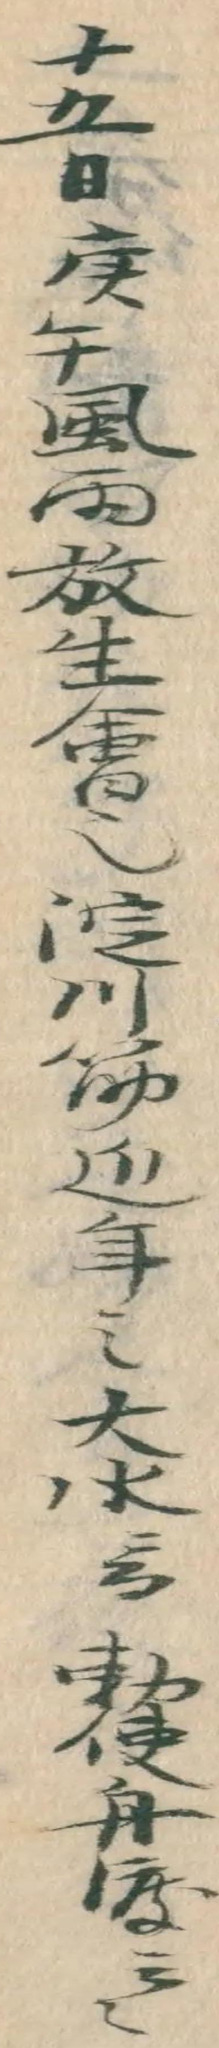十五日庚午風雨放生會也淀川筋近年之大水ニ而勅使舟渡云〻

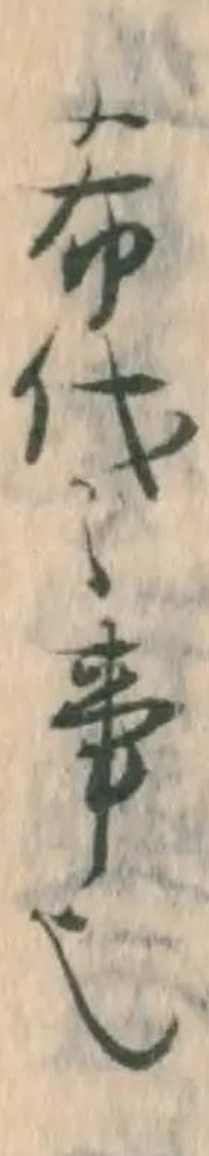希代之事也
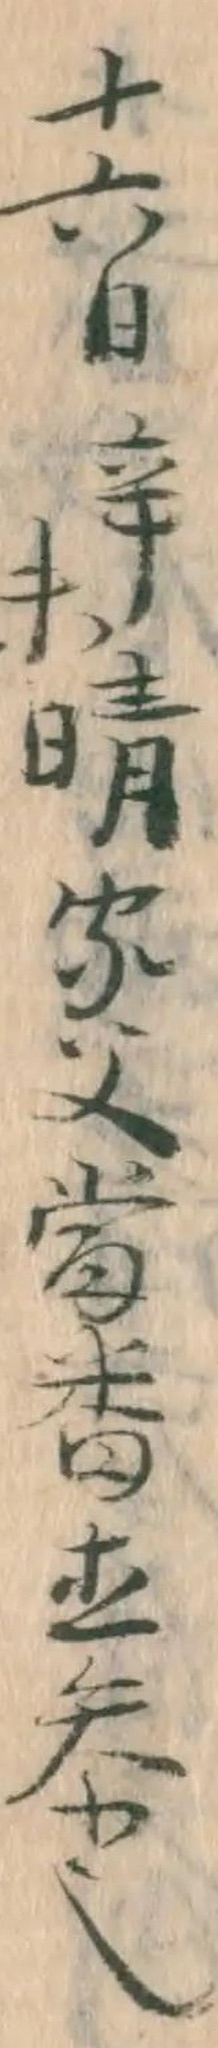十六日辛未晴家父當番直参也
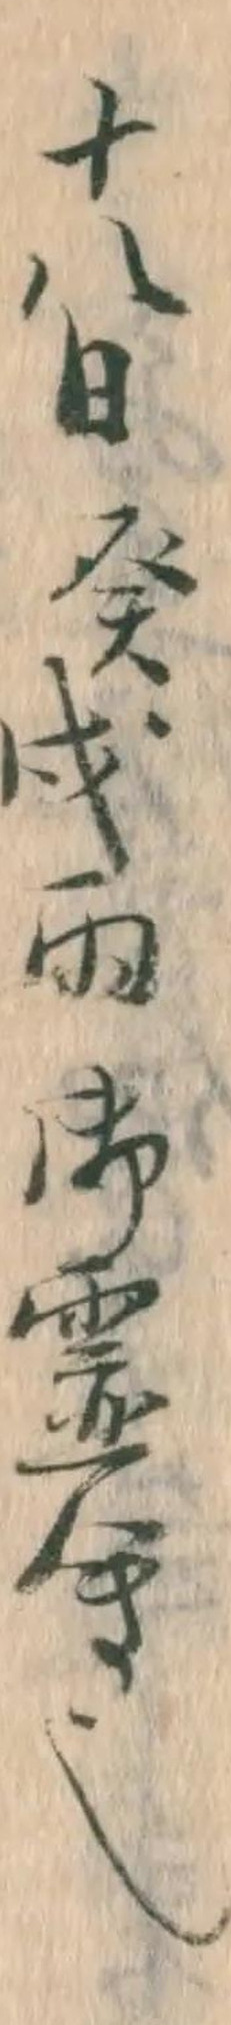十八日癸戌雨御霊會也
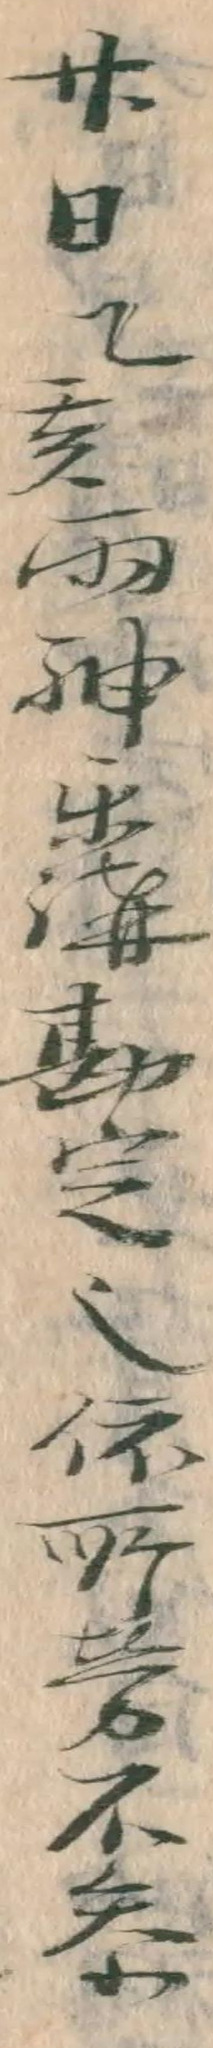廿日乙亥雨神楽講勘定也依所労不参
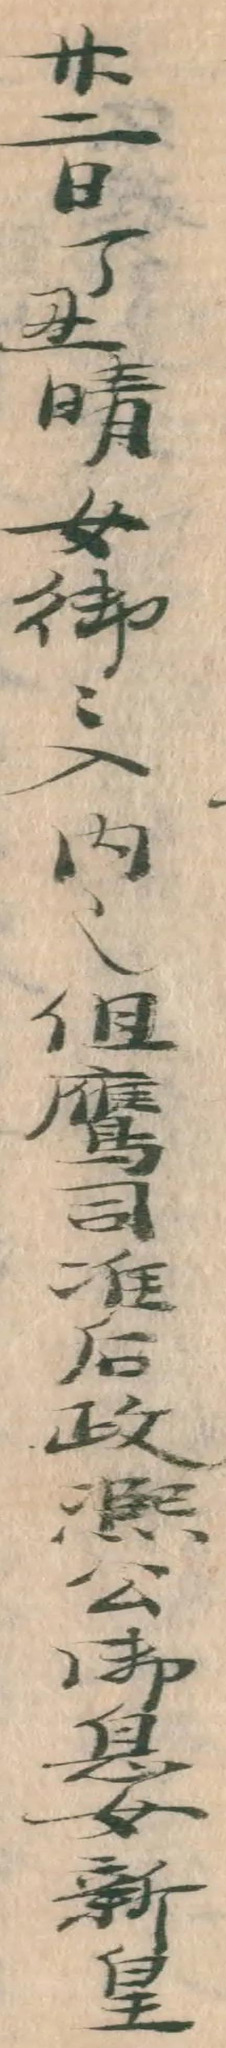廿二日丁丑晴女御御入内也但鷹司准后政煕公御息女新皇
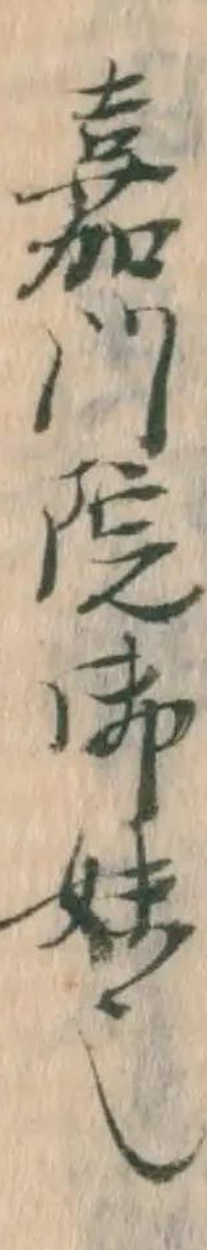嘉門院御妹也
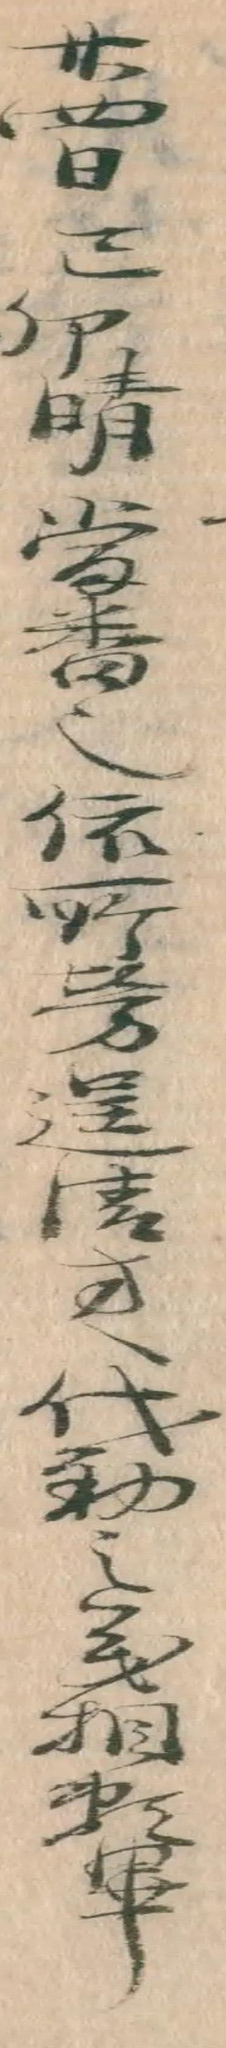廿四日己卯晴當番也依所労逞清方へ代勤之義相頼畢
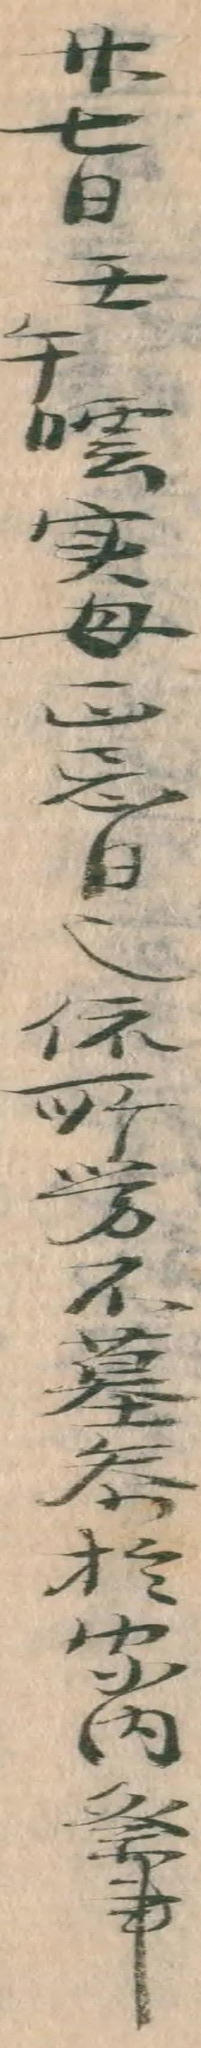廿七日壬午曇実母正忌日也依所労不墓参於家内祭事
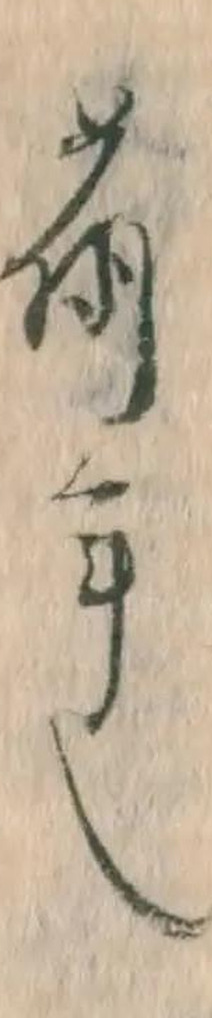如例年也
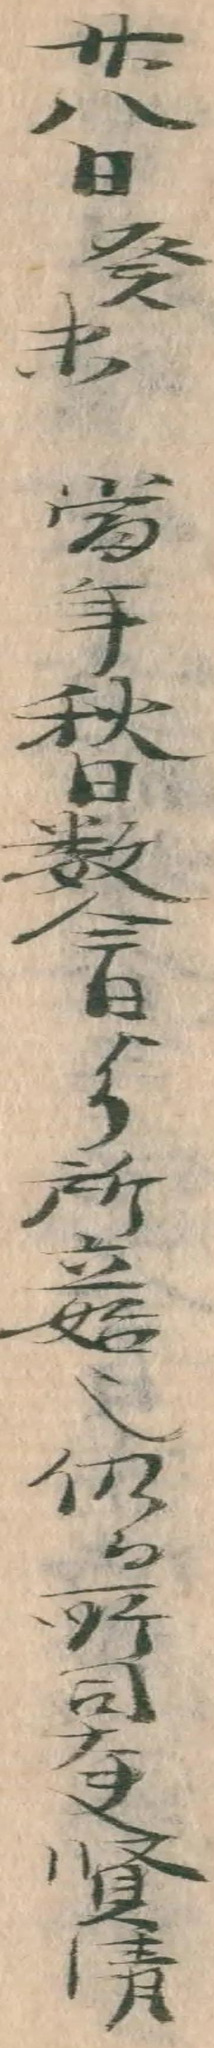廿八日癸未當年秋日数今日より所立始也仍而所司大夫賢清
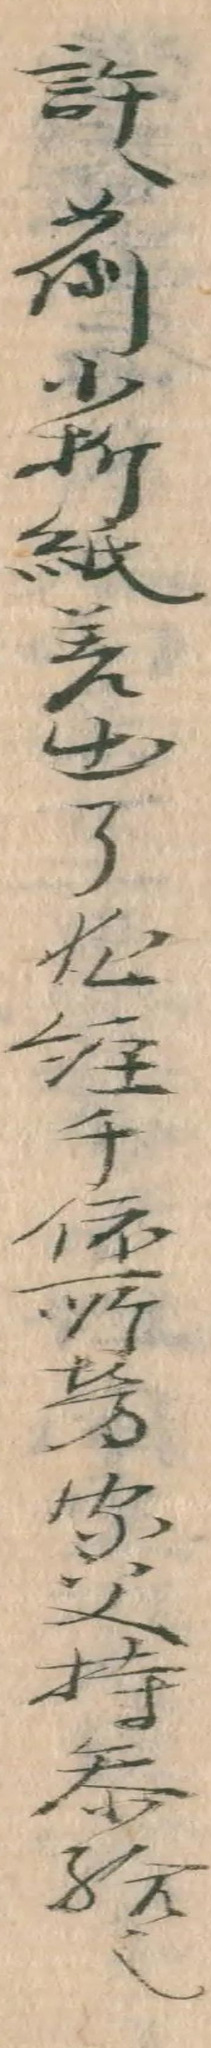許へ如例小折紙差出了尤経千依所労家父持参給也
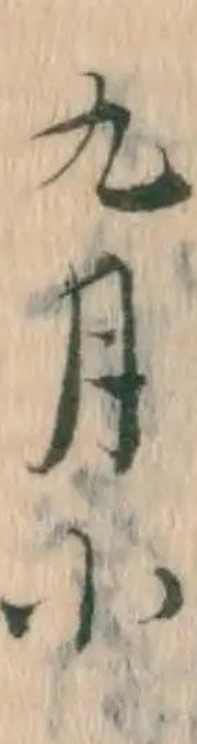九月小
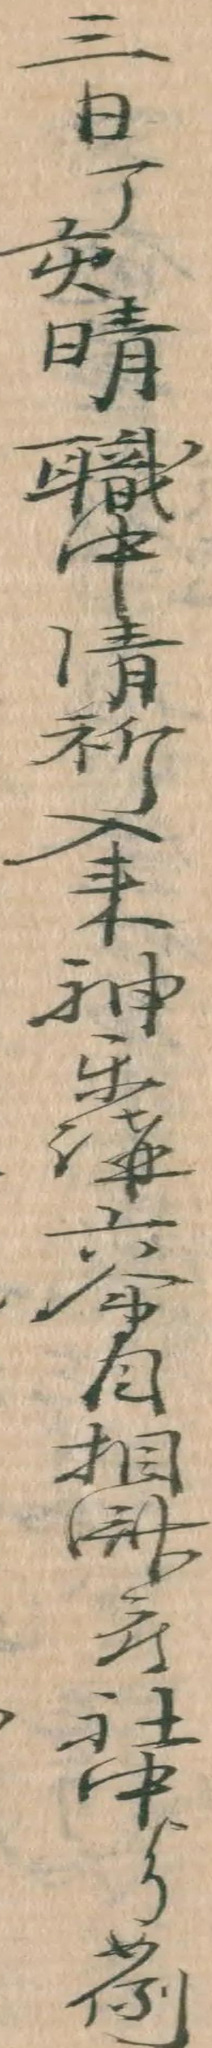三日丁亥晴職中清祈入来神楽講六會目相済ニ付社中より如例
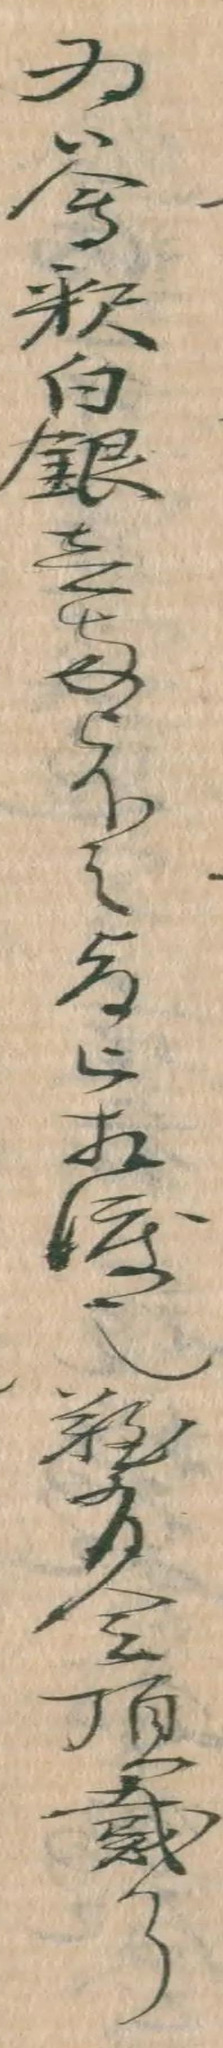為御會釈白銀壱両被下之旨被相渡之雖有合頂戴了
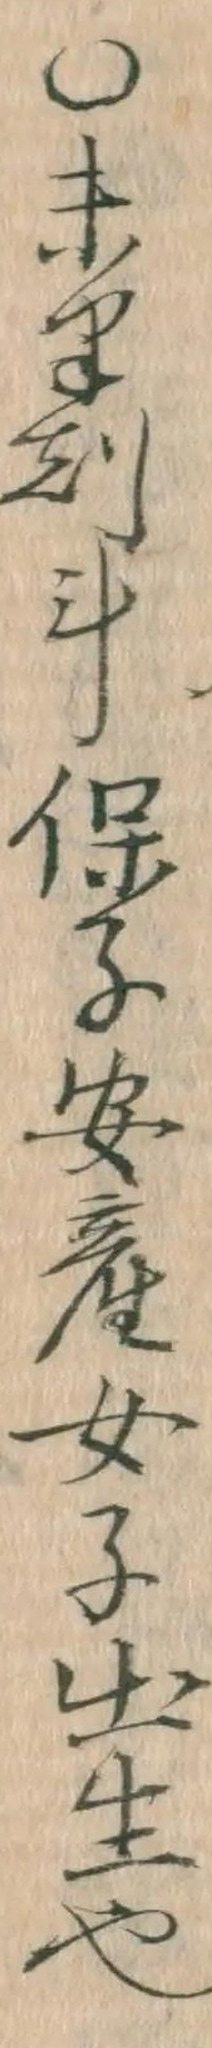○未半刻計保子安産女子出生也
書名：賀茂社記録. 第65冊
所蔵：国立国会図書館 National Diet Library, JAPAN
